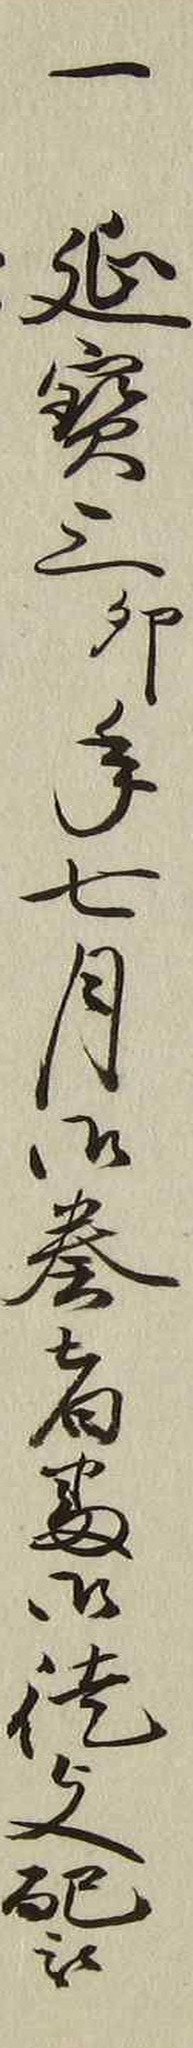一延宝三卯年七月御奏者番御徒支配被
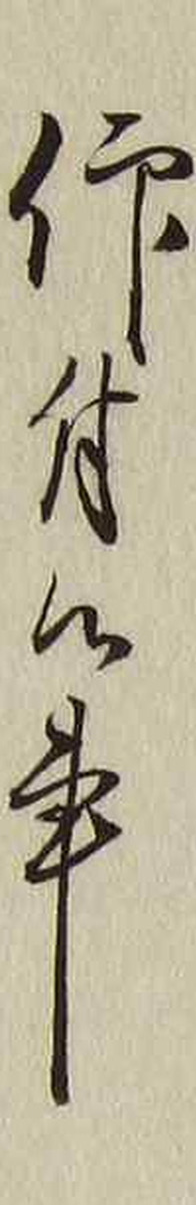仰付候事
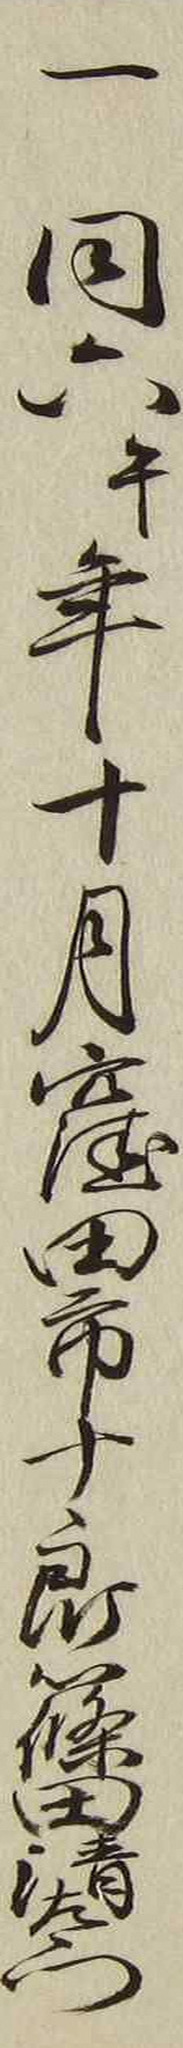一同六午年十月窪田市十郎篠田清左衛門
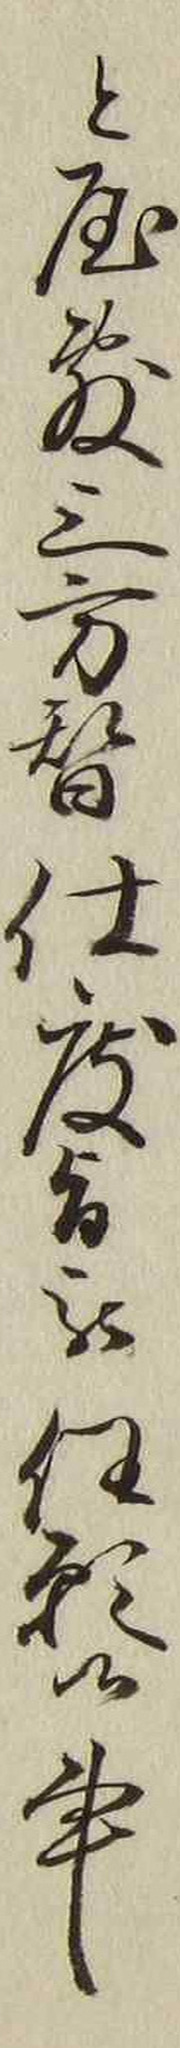と屋敷三方替仕度旨被任願候事

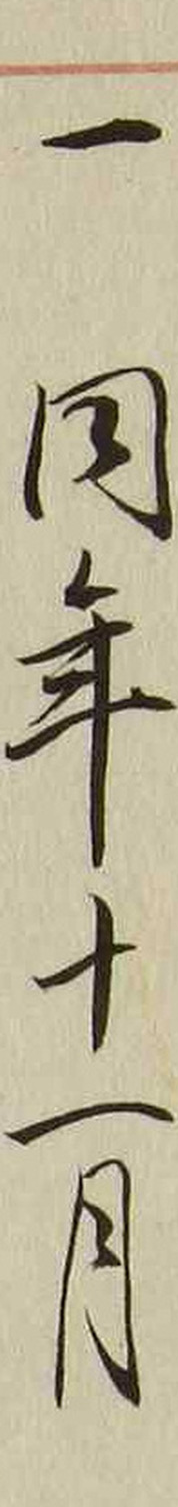一同年十一月
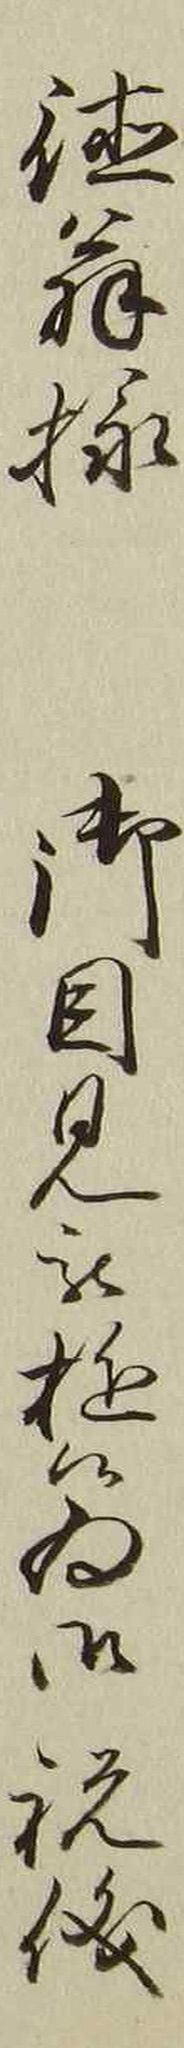徳翁様御目見被遊候為御祝儀
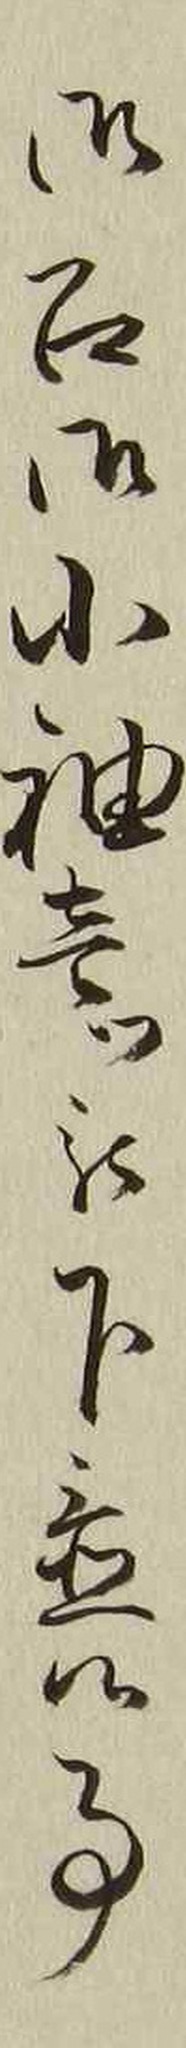御召御小袖壱ツ被下置候事
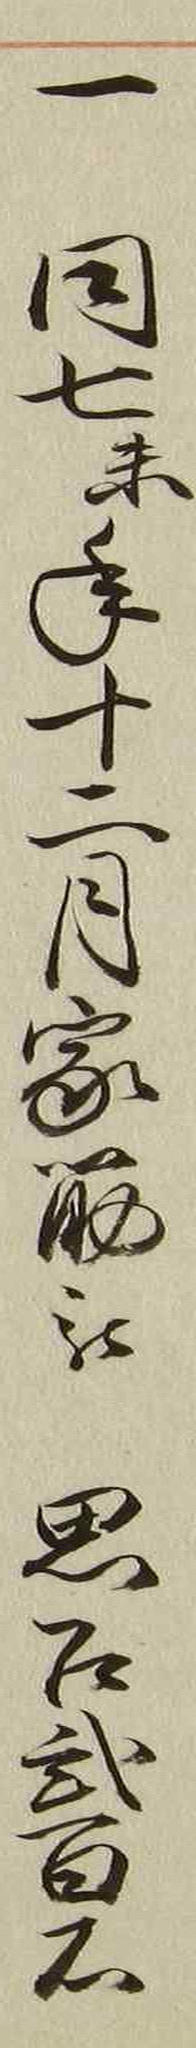一同七未年十二月家筋被思召弐百石
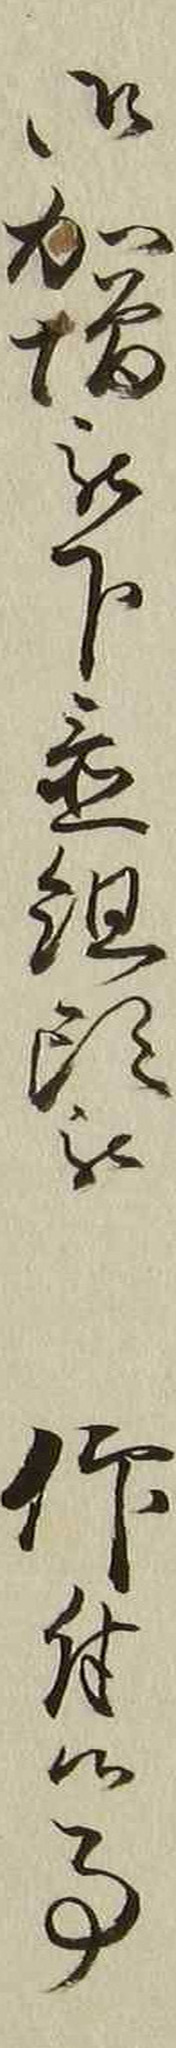御加増被下置組頭被仰付候事
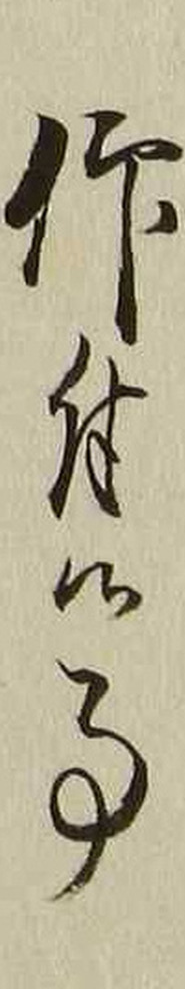仰付候事
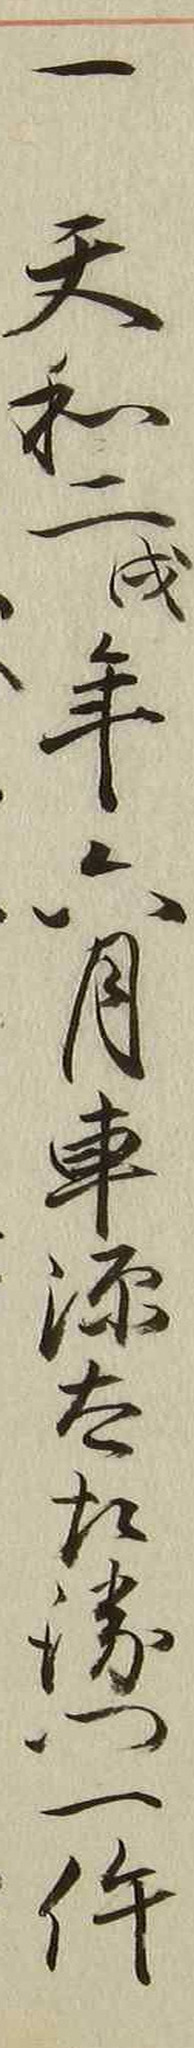一天和二戌年六月車源太左衛門一件
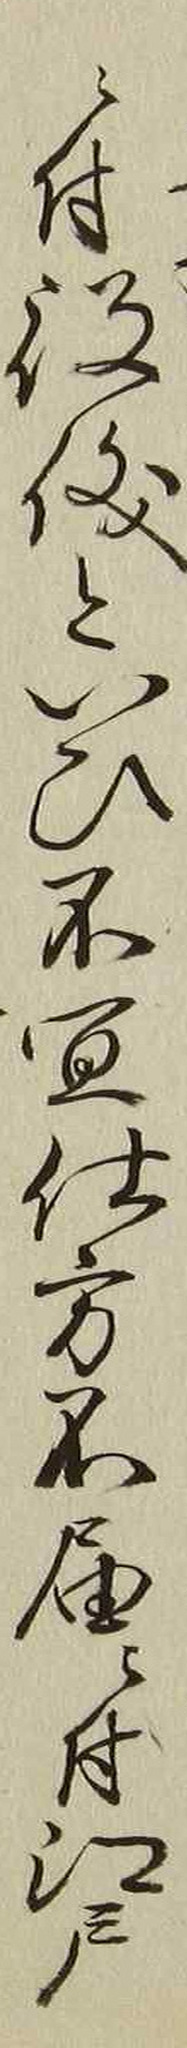ニ付役儀といひ不宜仕方不届ニ付江戸
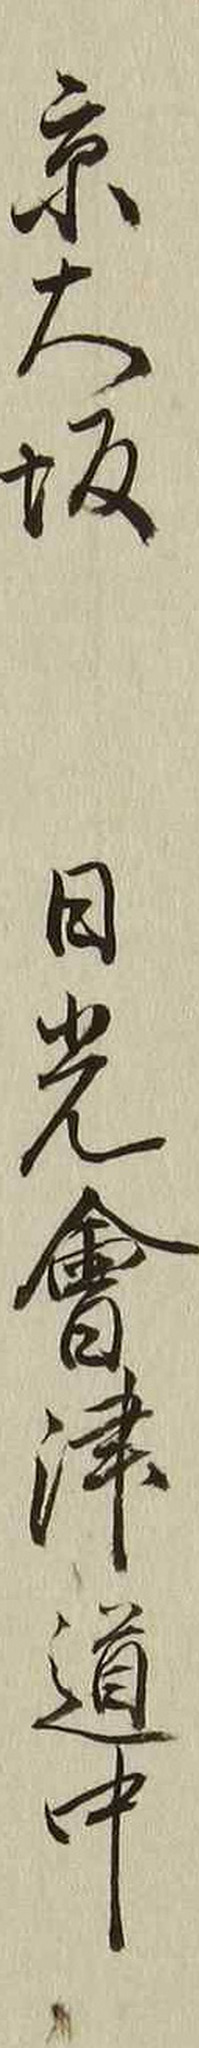京大坂日光会津道中
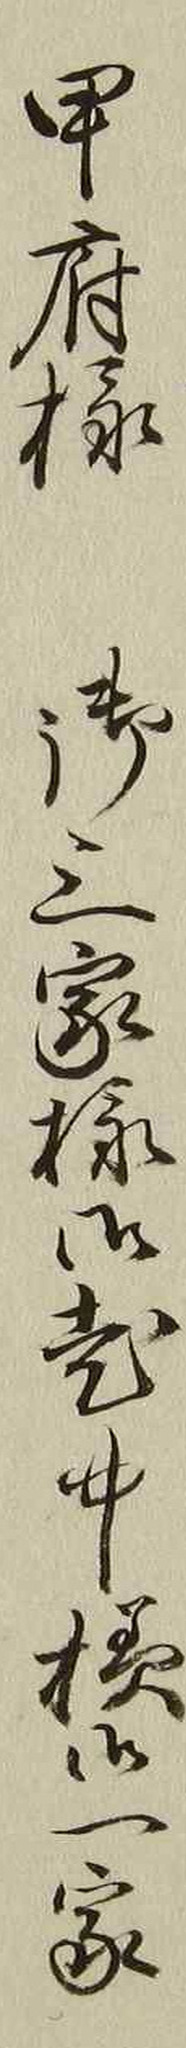甲府様御三家様御老中様御一家
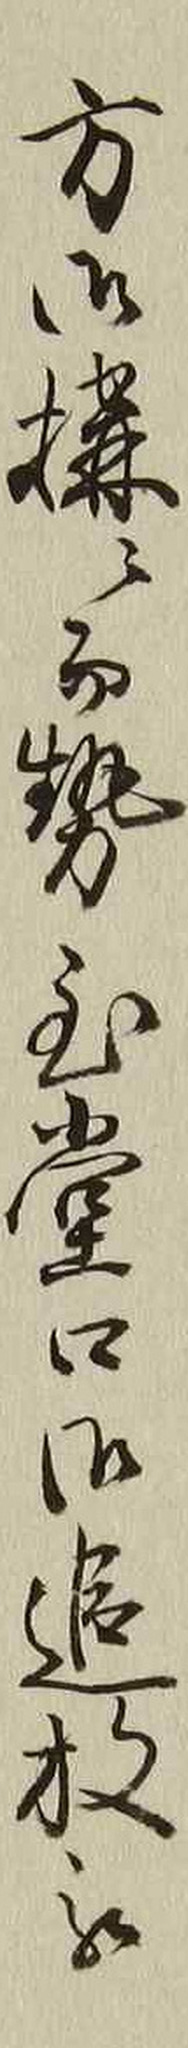方御構ニ而勢至堂口御追放被
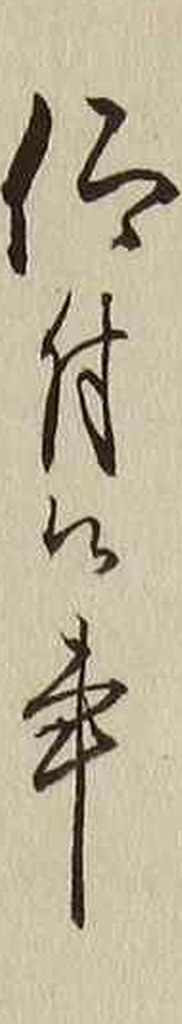仰付候事
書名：諸士系譜　巻之21　い之部21
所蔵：会津若松市立会津図書館
